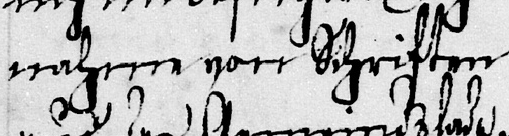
gnahme von Schriften
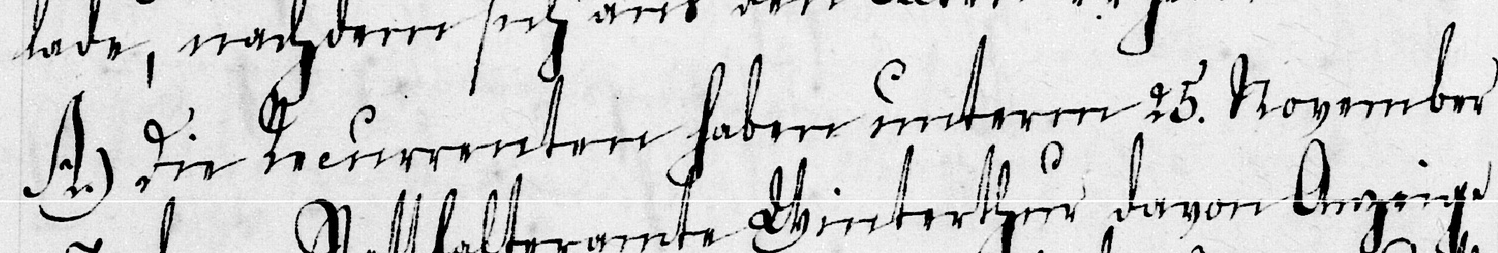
A.) Die Recurrenten haben unterm 25. November
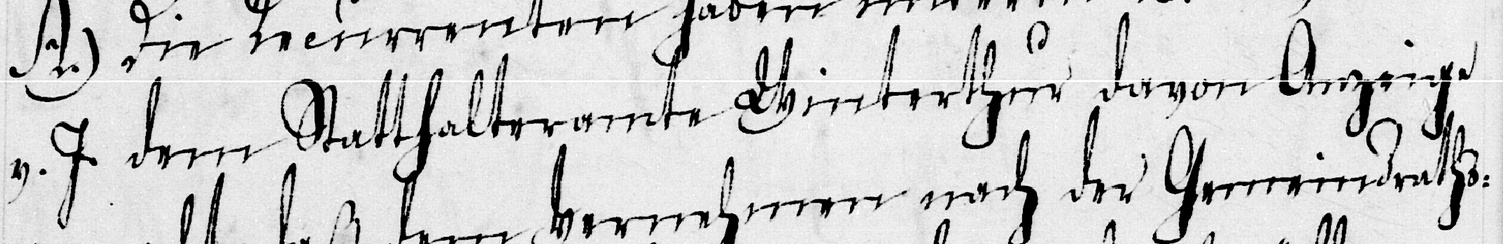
v. J. dem Statthalteramte Winterthur davon Anzeige
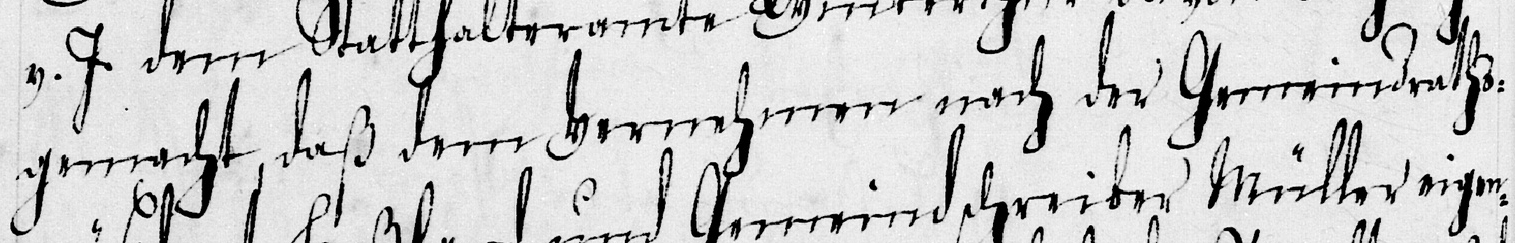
gemacht, daß dem Vernehmen nach der Gemeindraths¬
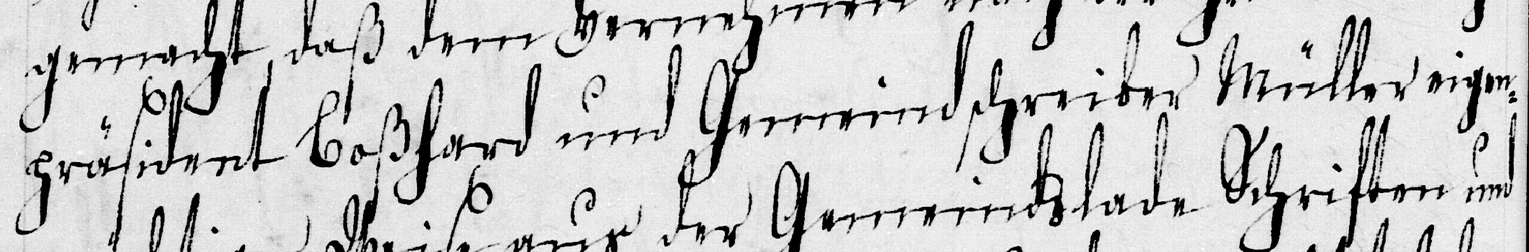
präsident Boßhard und Gemeindschreiber Müller eig¬
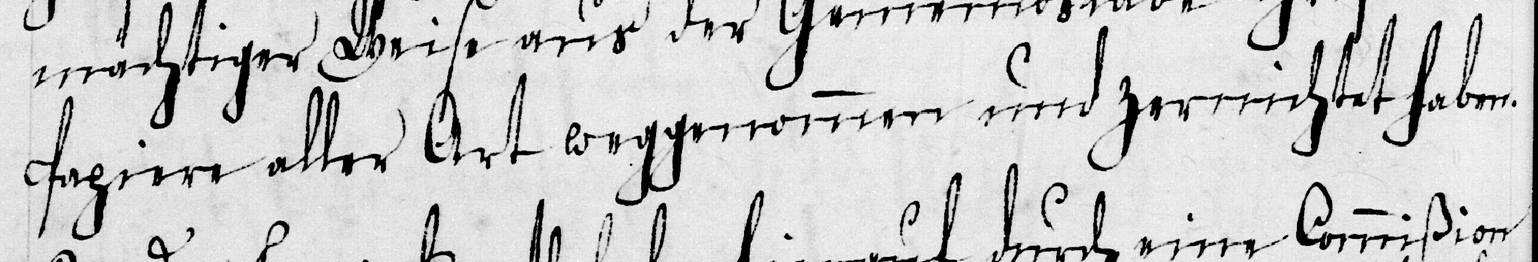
Papiere aller Art weggenommen und zernichtet haben.
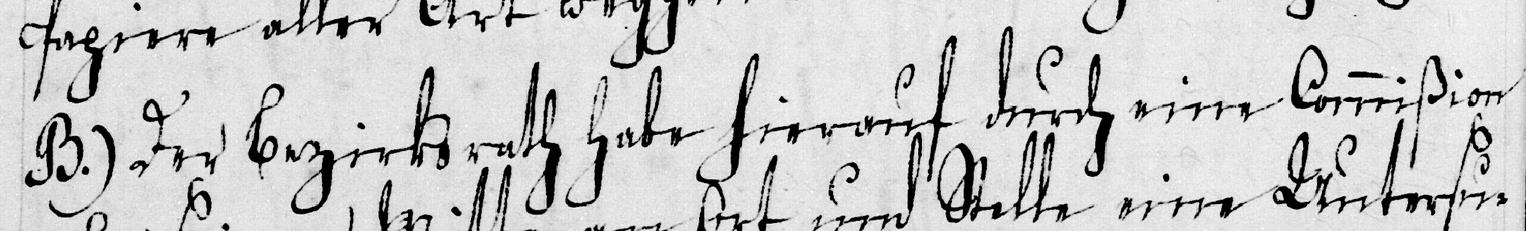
B.) Der Bezirksrath habe hierauf durch eine Commißion
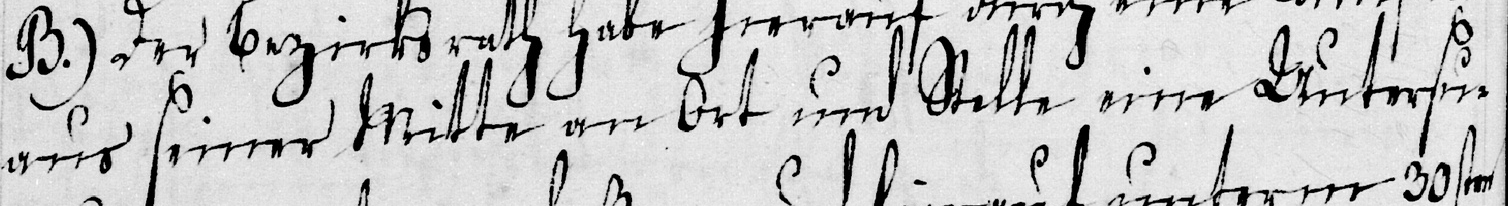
aus seiner Mitte an Ort und Stelle eine Untersu¬
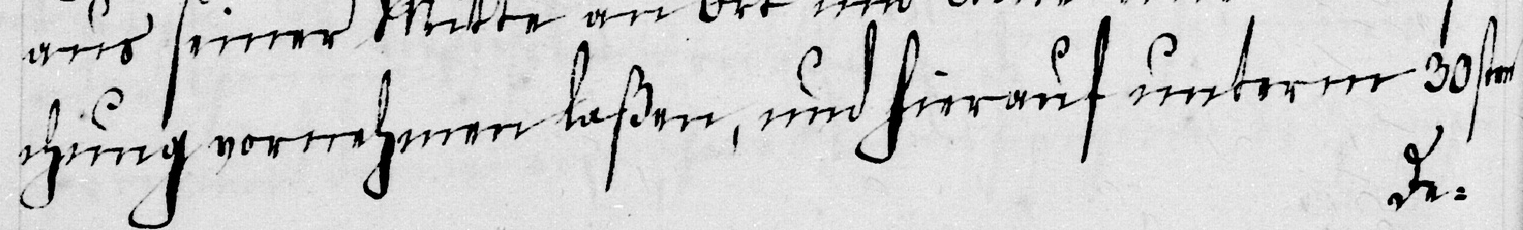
chung vornehmen laßen, und hierauf unterm 30sten
